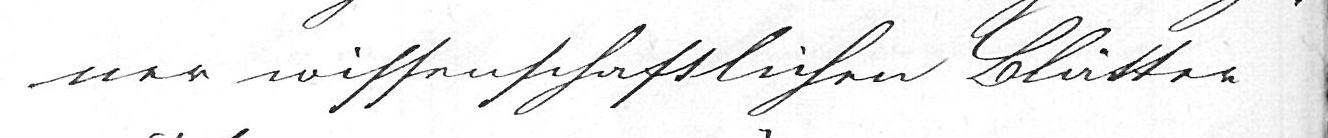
ner wissenschaftlichen Blätter
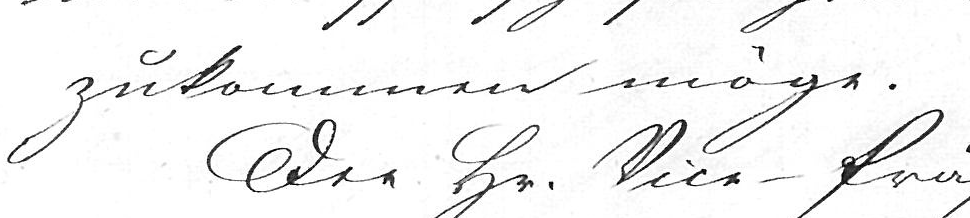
zukommen möge.
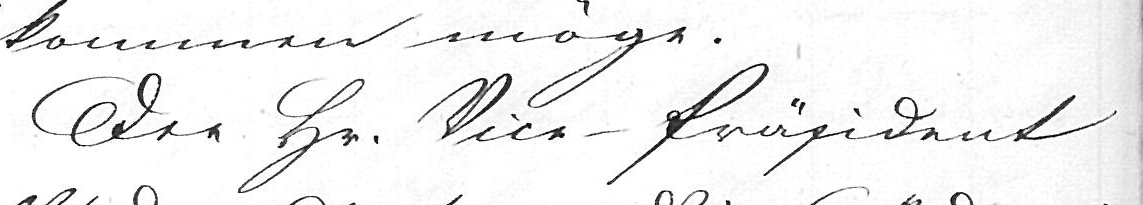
Der Hr. Vice-Präsident
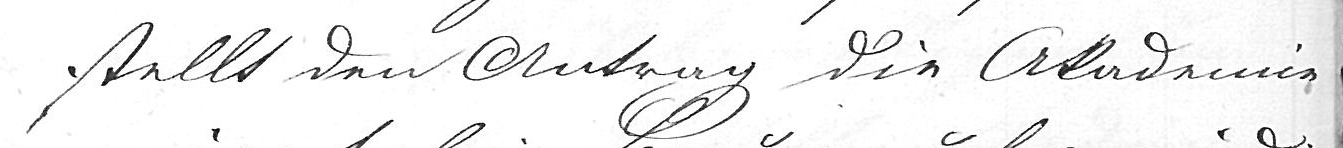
stellt den Antrag die Akademie
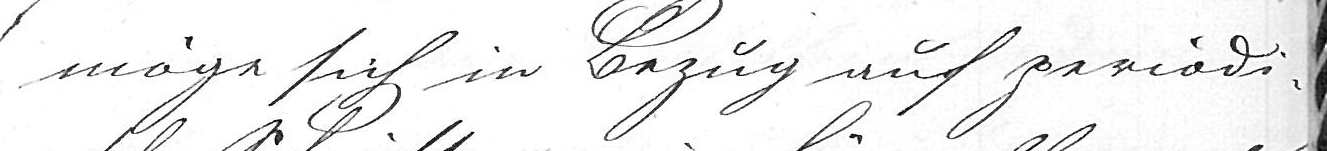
möge sich in Bezug auf periodi-
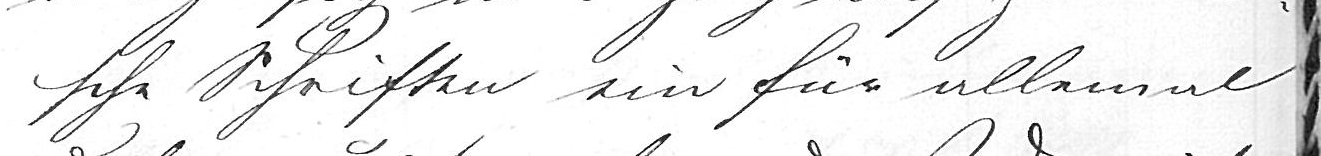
sche Schriften ein für allemal
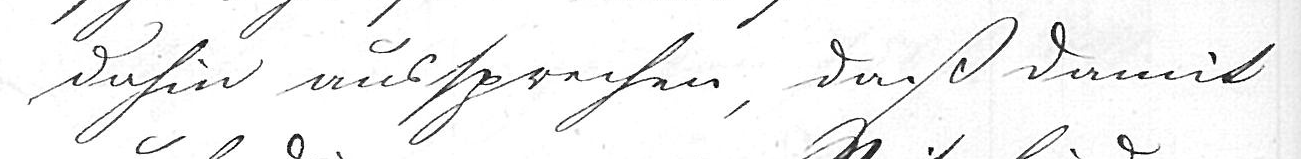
dahin aussprechen, daß damit
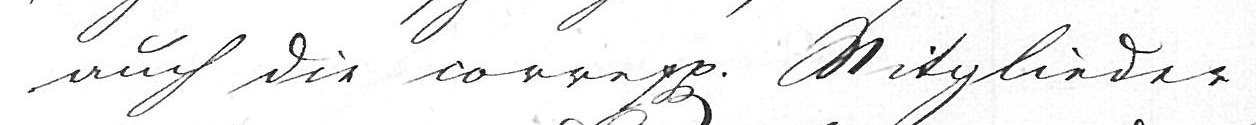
auch die corresp. Mitglieder
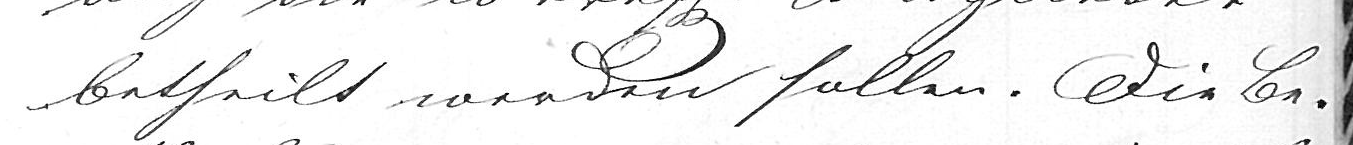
betheilt werden sollen. Die Be-
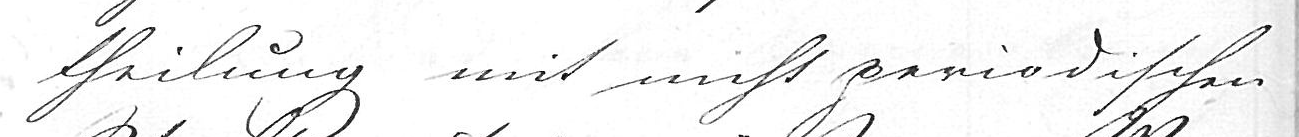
theilung mit nicht periodischen
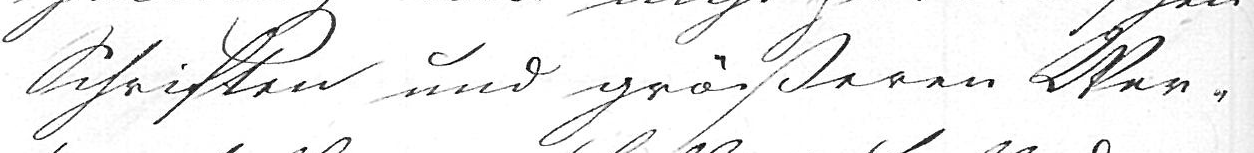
Schriften und größeren Wer-
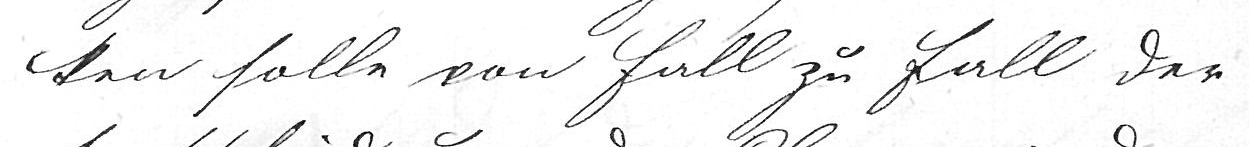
ken solle von Fall zu Fall der
